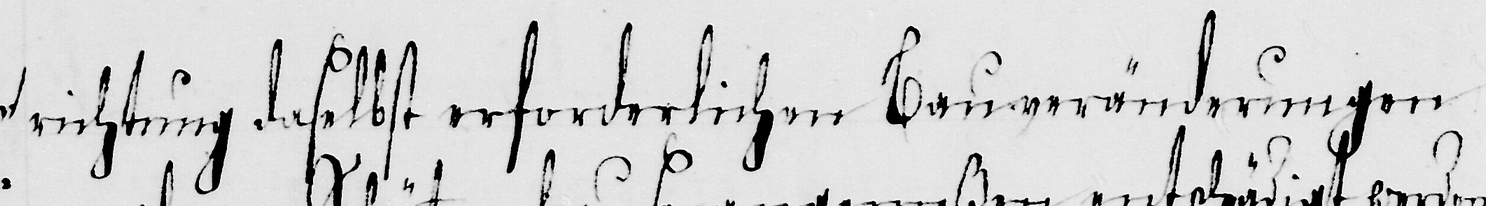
richtung daselbst erforderlichen Bauveränderungen
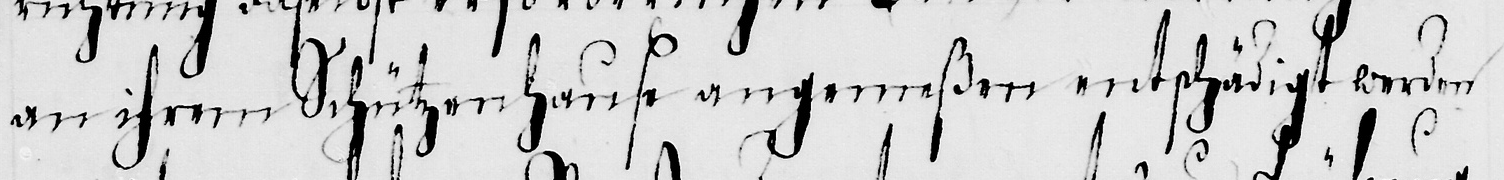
an ihrem Schützenhause angemeßen entschädigt werden
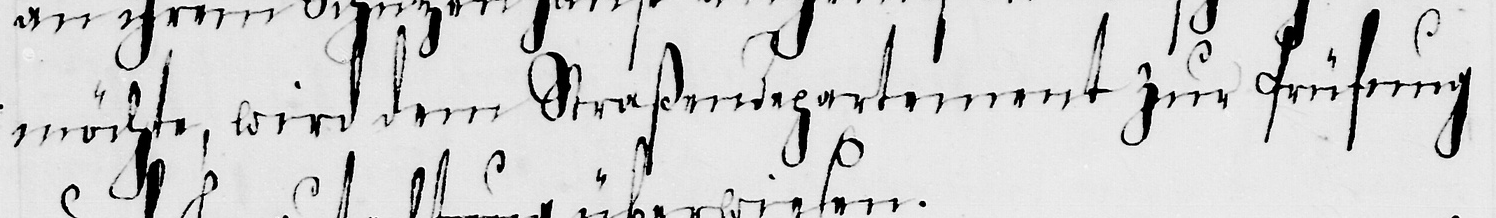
möchte, wird dem Straßendepartement zur Prüfung
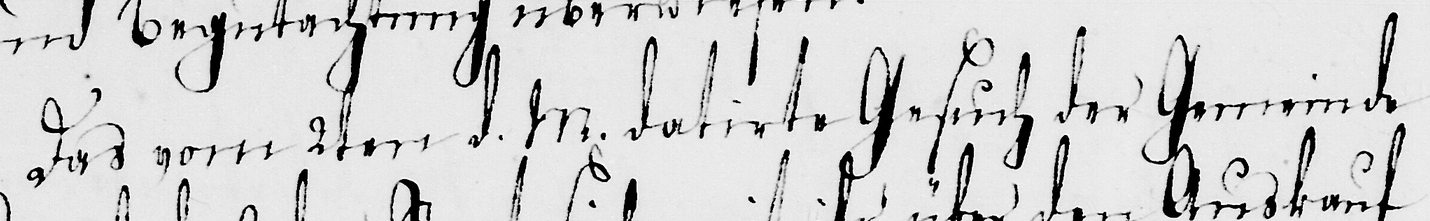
Das vom 2ten d. M. datirte Gesuch der Gemeinde
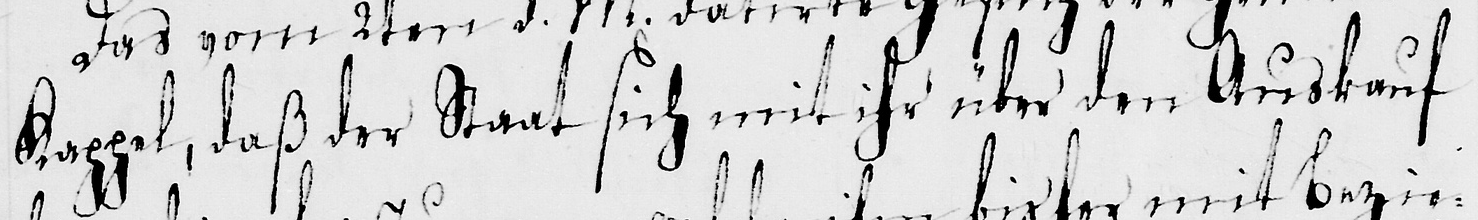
Kappel, daß der Staat sich mit ihr über den Auskauf
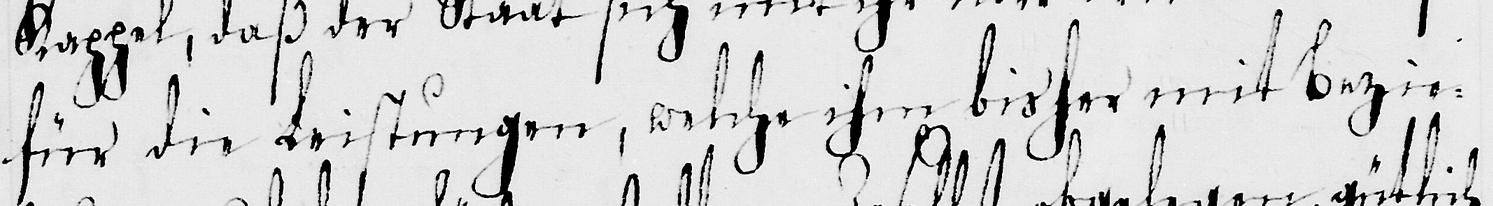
für die Leistungen, welche ihm bisher mit Bezie¬
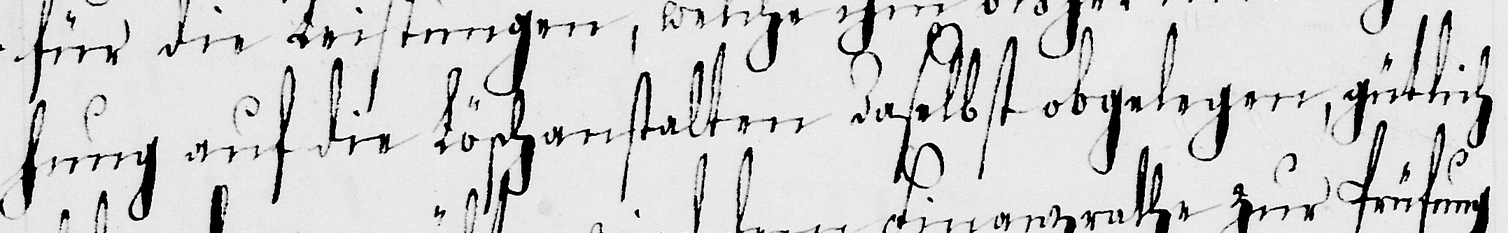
hung auf die Löschanstalten daselbst obgelegen, gütlich
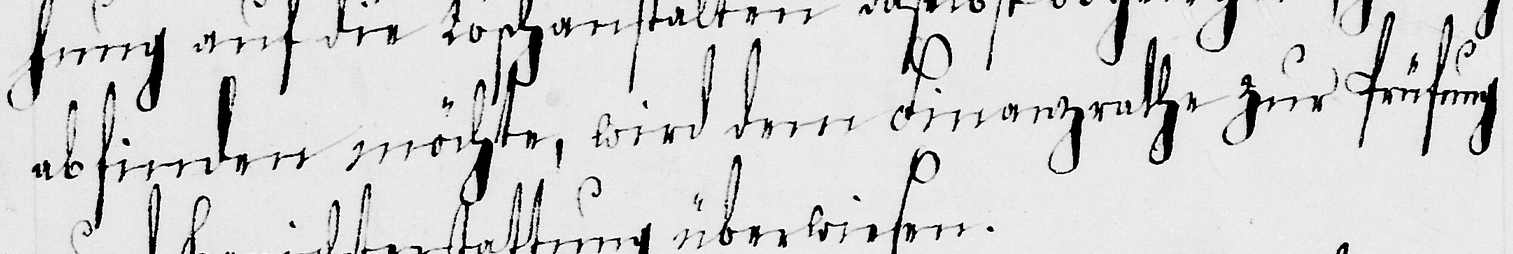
abfinden möchte, wird dem Finanzrathe zur Prüfung
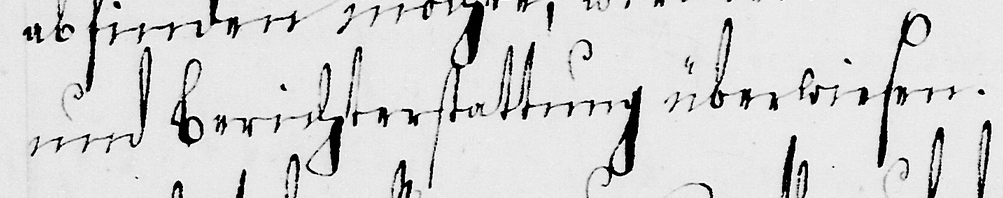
und Berichterstattung überwiesen.
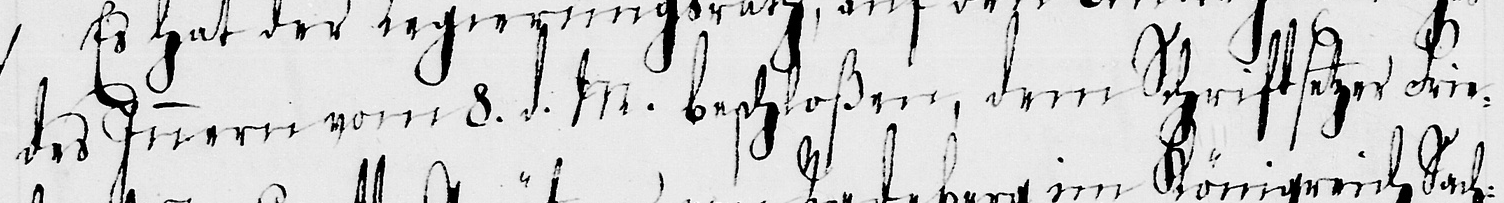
des Innern vom 8. d. M. beschloßen, dem Schriftsetzer Frie¬
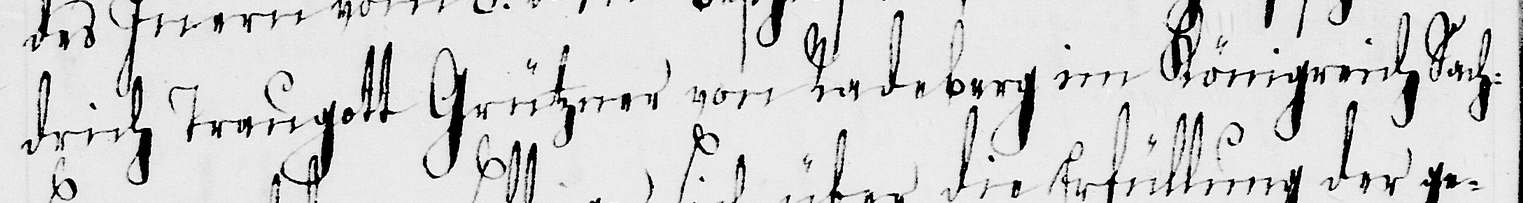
drich Traugott Grützner von Radeberg im Königreich Sac¬
